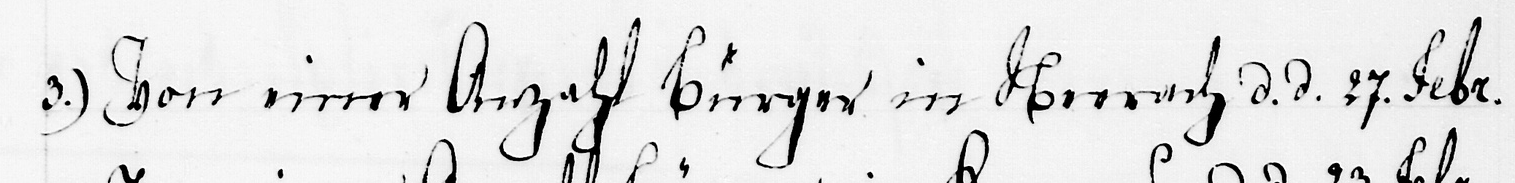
3.) Von einer Anzahl Bürger in Neerach d. d. 27. Febr.
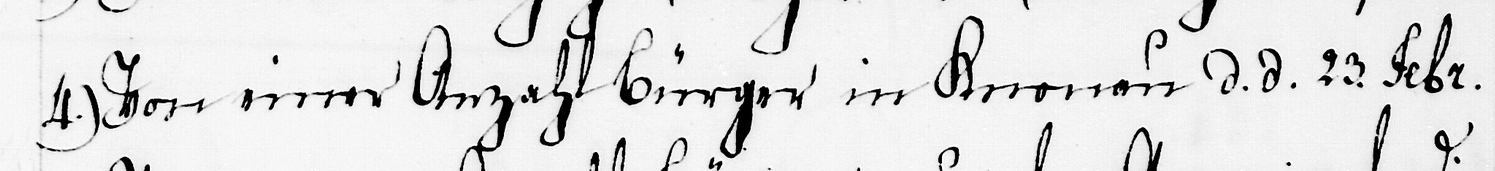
4.) Von einer Anzahl Bürger in Knonau d. d. 23. Febr.
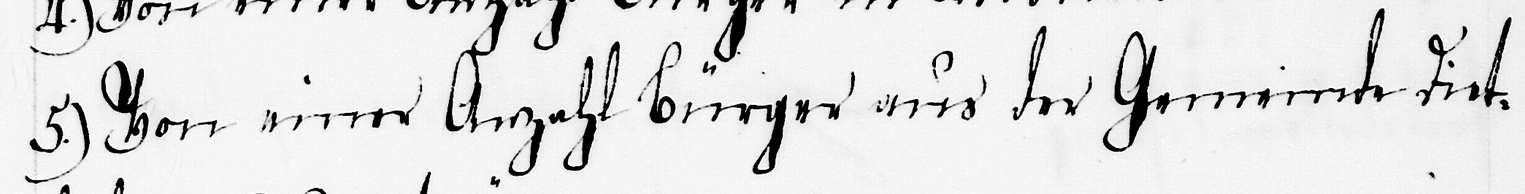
5.) Von einer Anzahl Bürger aus der Gemeinde Diet¬
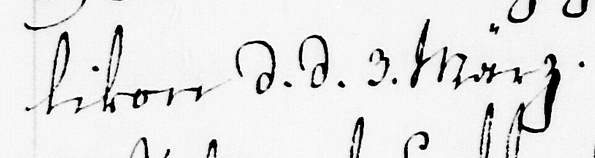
likon d. d. 3. März.
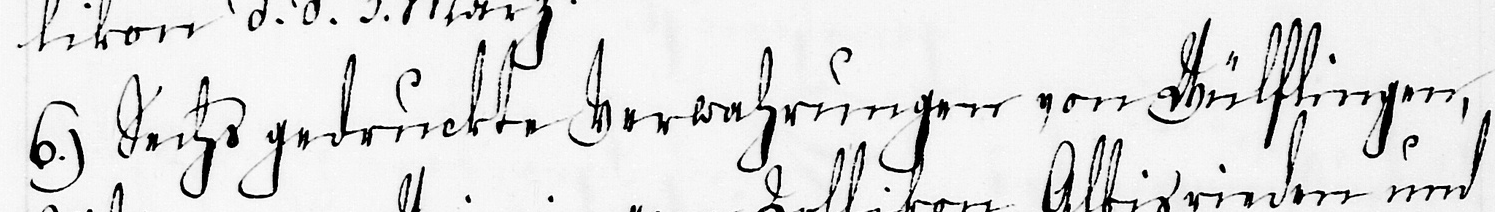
6.) Sechs gedruckte Verwahrungen von Wülflingen,
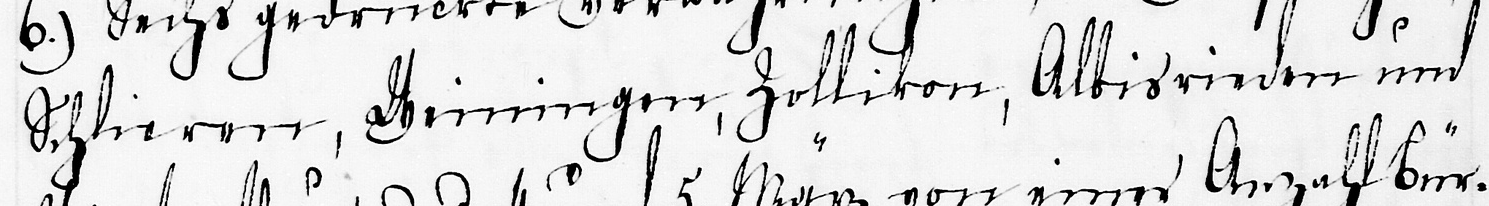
Schlieren, Weiningen, Zollikon, Albisrieden und
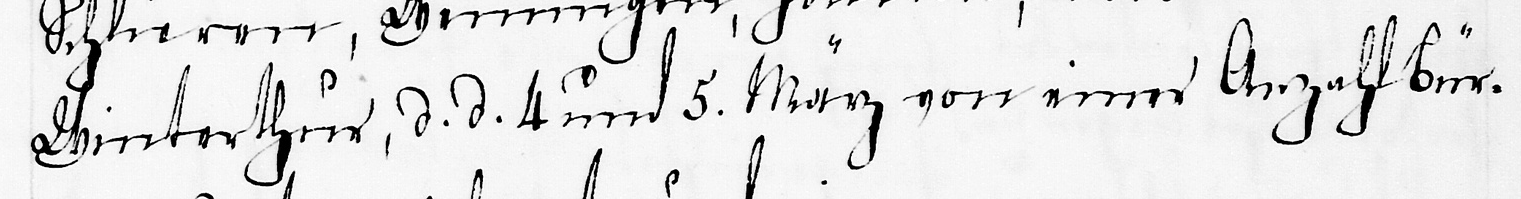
Winterthur, d. d. 4 und 5. März von einer Anzahl Bür¬
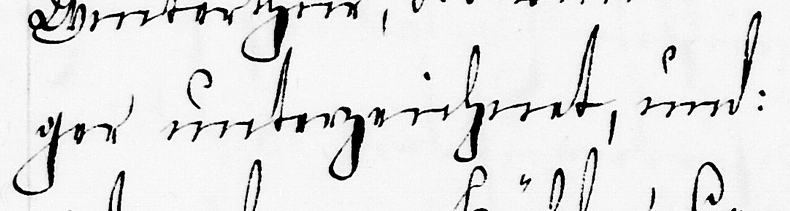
ger unterzeichnet, und:
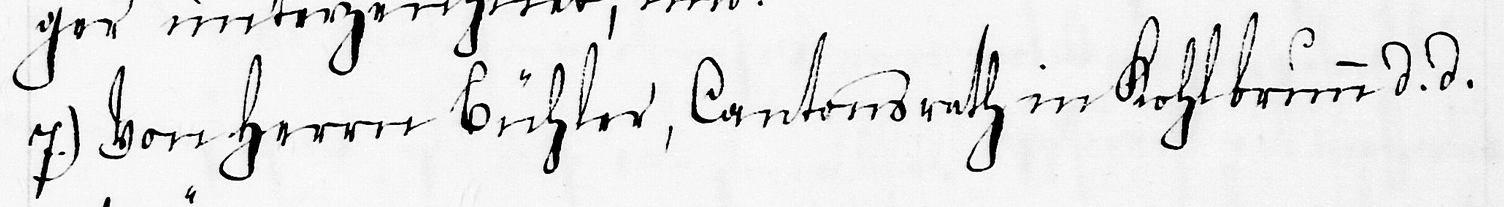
7.) Von Herrn Bühler, Cantonsrath in Kohlbrunn d.
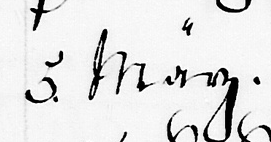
5. März.
